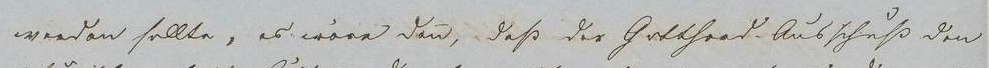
werden sollte, es wäre denn, daß der Gotthard-Ausschuß den
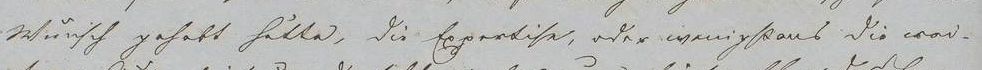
Wunsch gehabt hätte, die Expertise, oder wenigstens die wei-
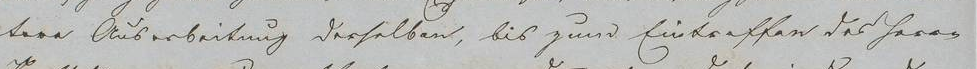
tere Ausarbeitung derselben, bis zum Eintreffen des Herrn
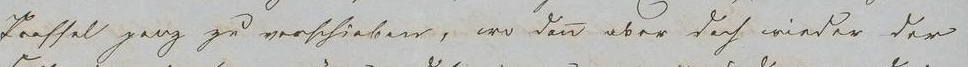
Pressel ganz zu verschieben, wo dann aber doch wieder der
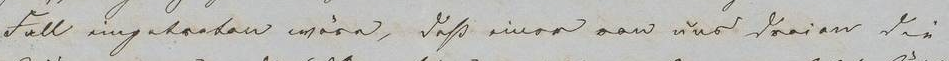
Fall eingetreten wäre, daß einer von uns dreien die
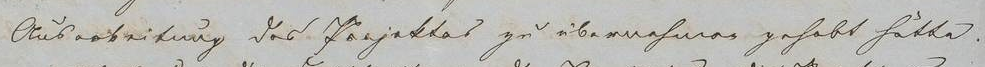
Ausarbeitung des Projektes zu übernehmen gehabt hätte.
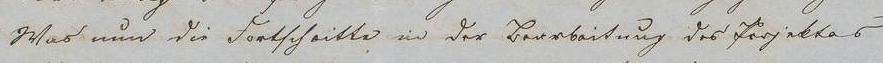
Was nun die Fortschritte in der Bearbeitung des Projektes
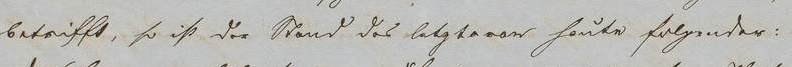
betrifft, so ist der Stand der letzteren heute folgender:
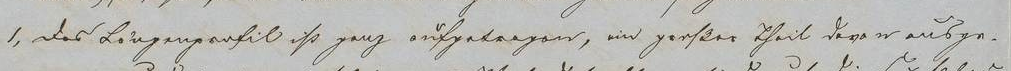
1, Das Längenprofil ist ganz aufgetragen, ein großer Theil davon ausge-
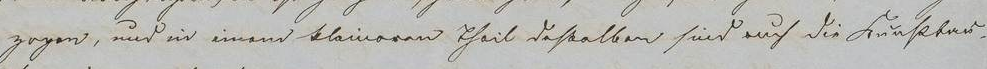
zogen, und in einem kleineren Theil desselben sind auch die Kunstbau-
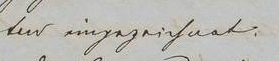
ten eingezeichnet.
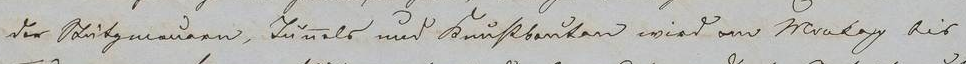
der Stützmauern, Tunnels und Kunstbauten wird am Montag bis
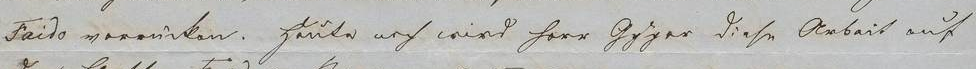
Faido vorrücken. Heute noch wird Herr Gyger diese Arbeit auf
